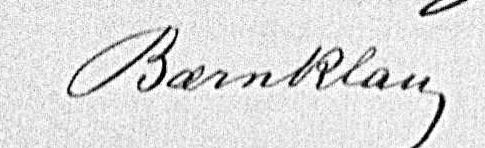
Baernklau
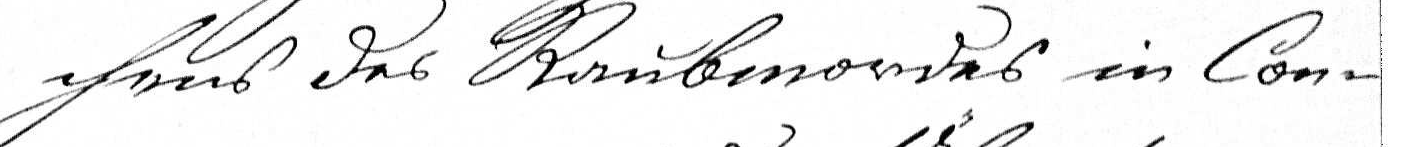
chens des Raubmordes in Con¬
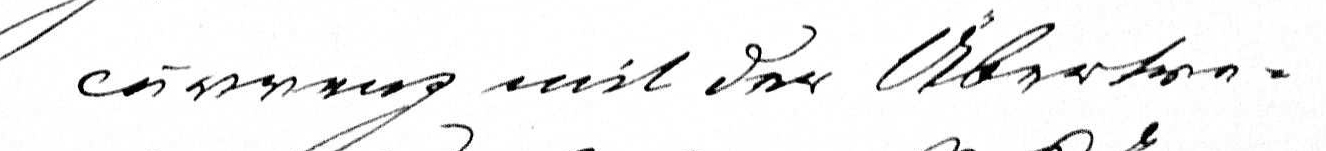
currenz mit der Übertre¬
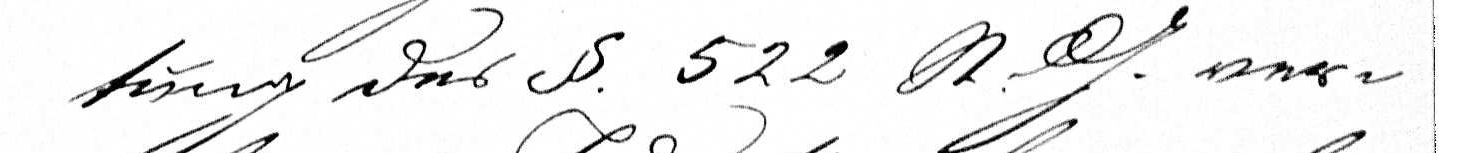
tung des §522 St. G. ver¬
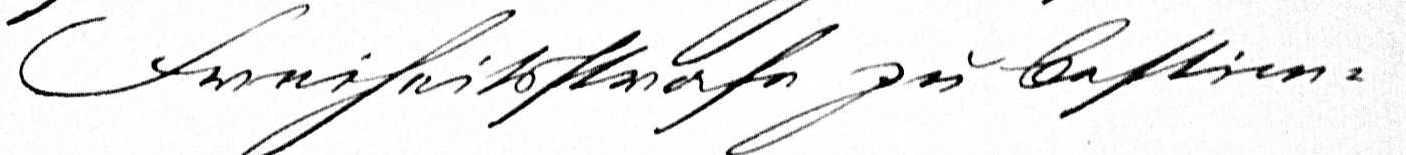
Freiheitsstrafe zu bestim
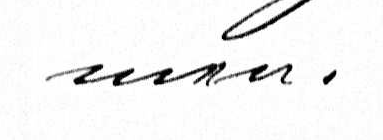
men.
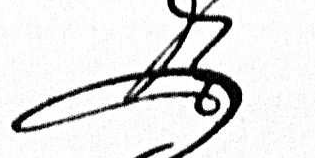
FJ
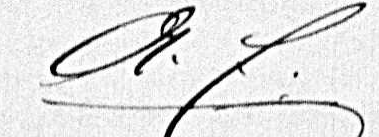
A. E.
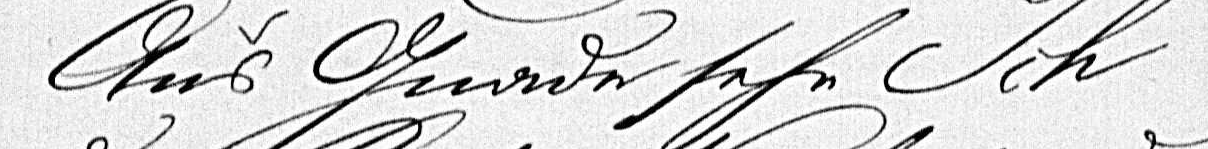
Aus Gnade sehe Ich
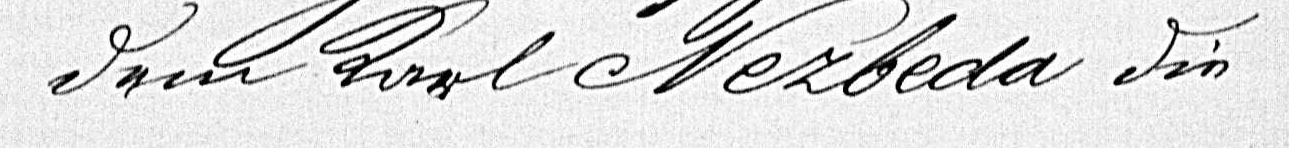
dem Karl Nezbeda die,
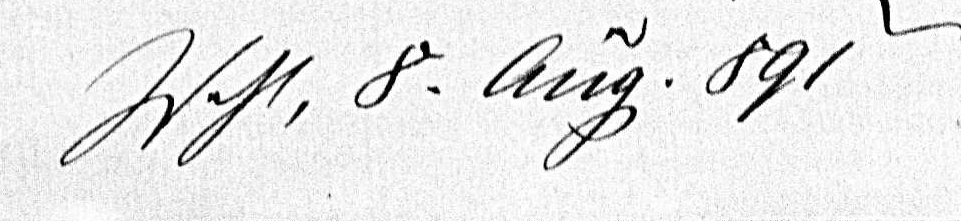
Ischl 8. August 1891
